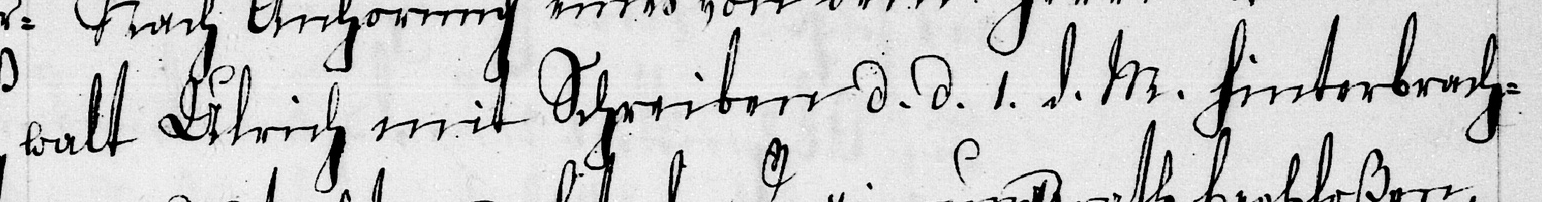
walt Ulrich mit Schreiben d. d. 1. d. M. hinterbrach¬
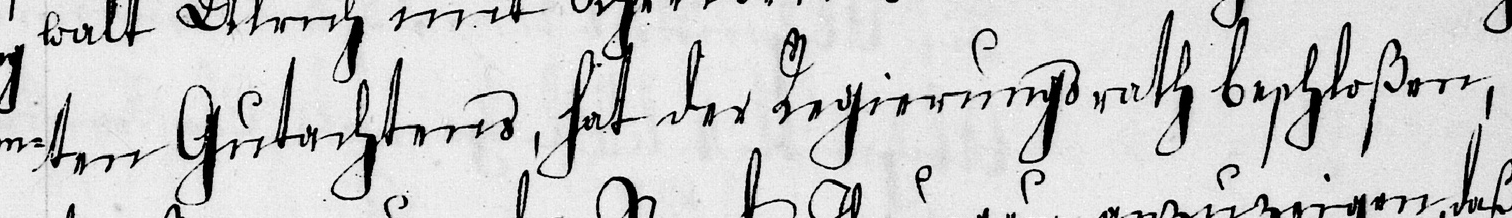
ten Gutachtens, hat der Regierungsrath beschloßen,
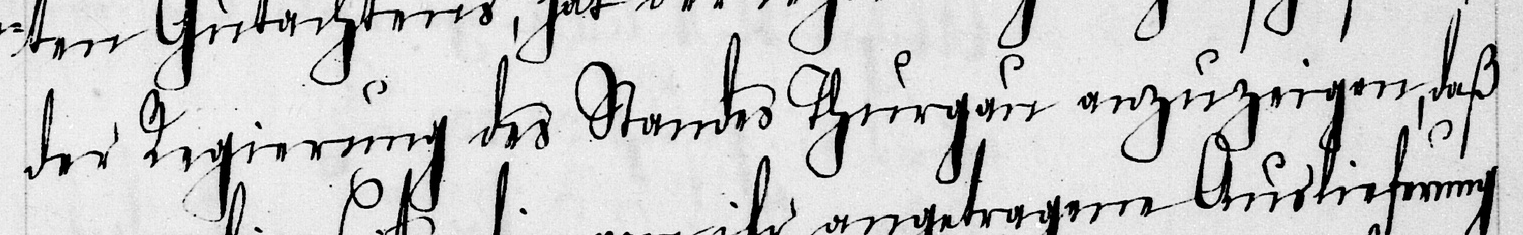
der Regierung des Standes Thurgau anzuzeigen, daß
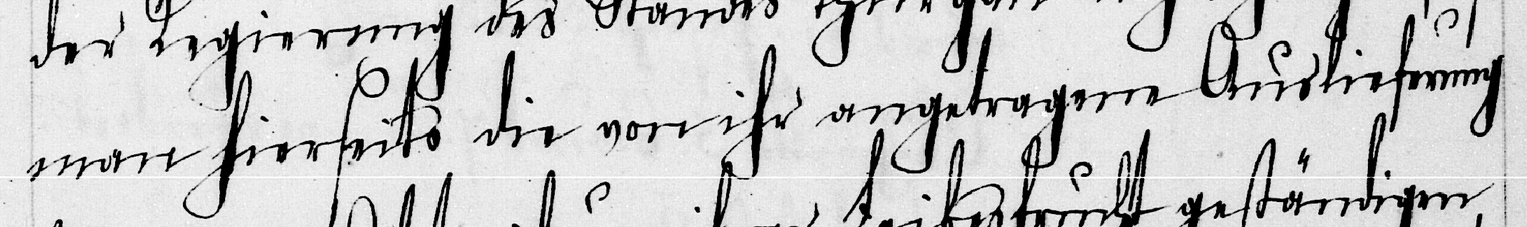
man hierseits die von ihr angetragene Auslieferung
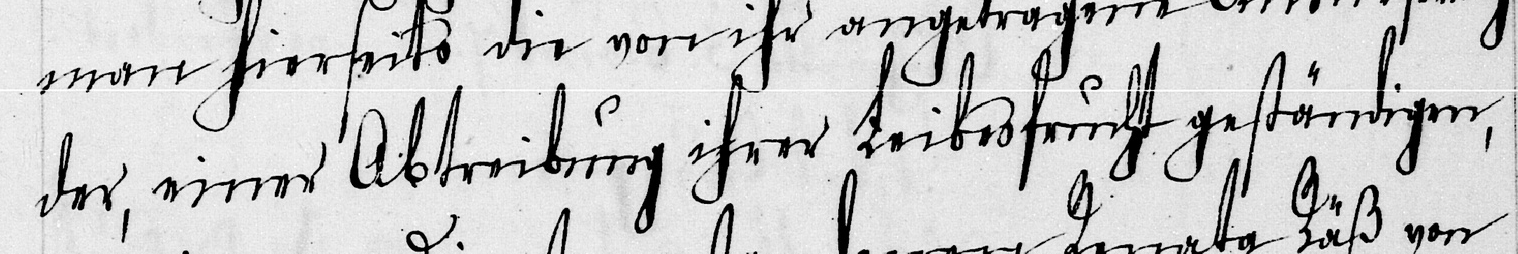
der, einer Abtreibung ihrer Leibesfrucht geständigen,
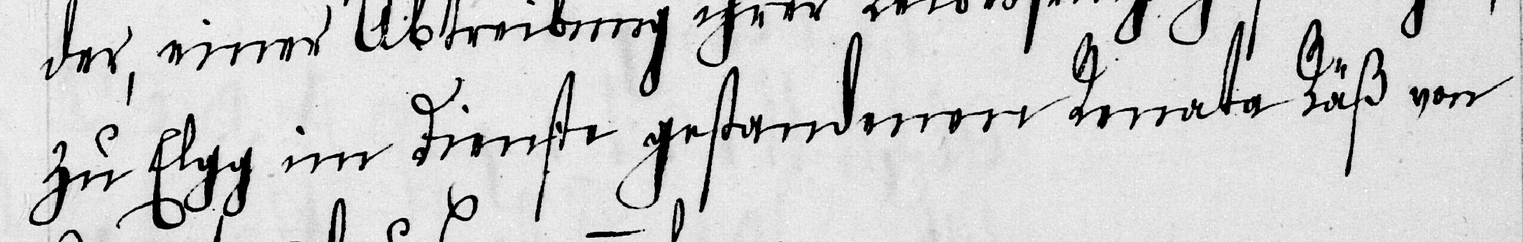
zu Elgg im Dienste gestandenen Renate Räß von
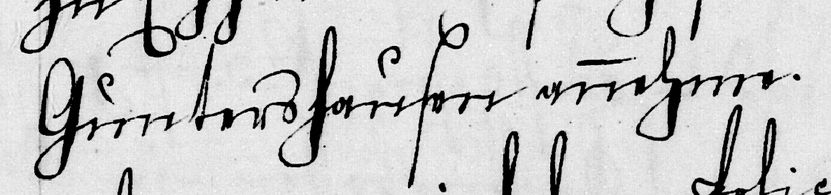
Guntershausen annehme.
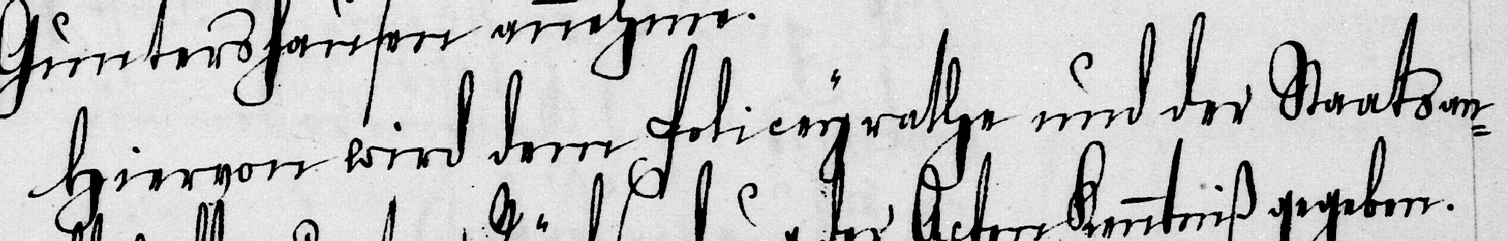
Hiervon wird dem Policeyrathe und der Staatsan¬
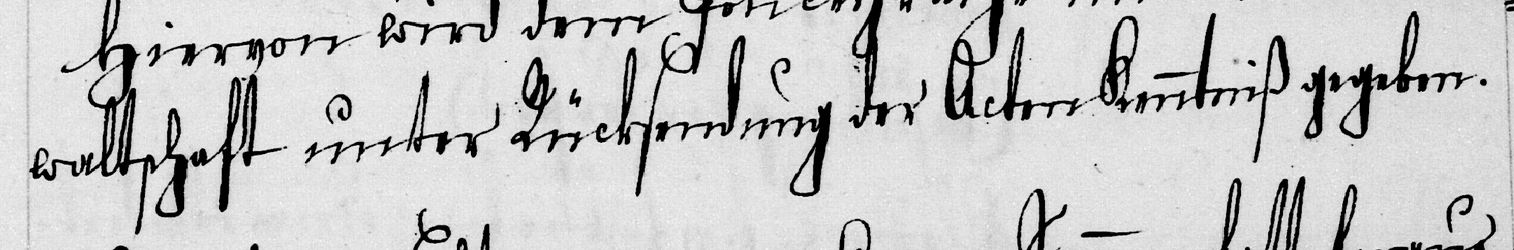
waltschaft unter Rücksendung der Acten Kenntniß gege¬
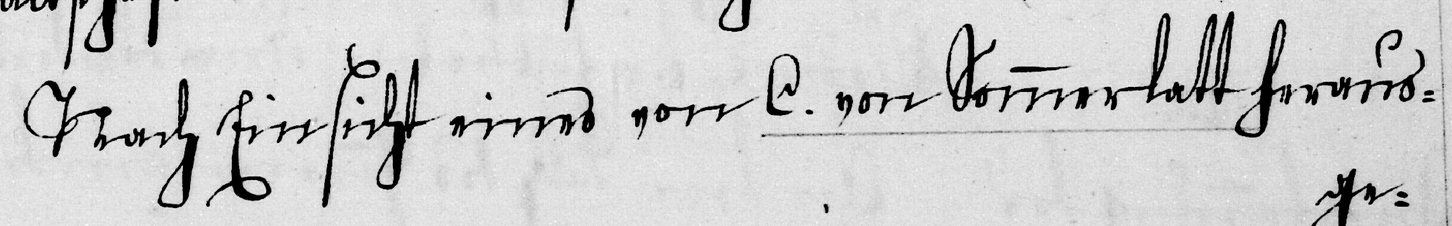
Nach Einsicht eines von C. von Sommerlatt heraus-
